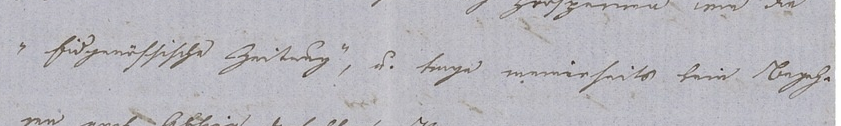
«Eidgenössische Zeitung», u. trage meinerseits kein Begeh-
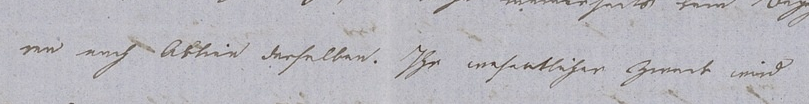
ren nach Aktien derselben. Ihr wesentlicher Zweck wird
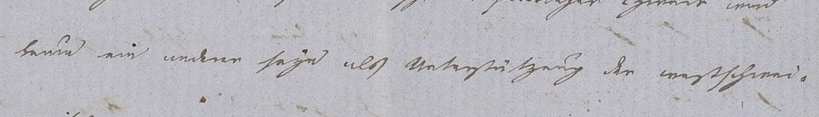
kaum ein anderer seyn als Unterstützung der westschwei-
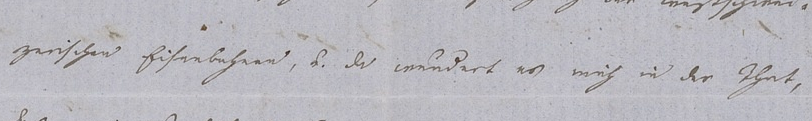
zerischen Eisenbahnen, u. da wundert es mich in der That,
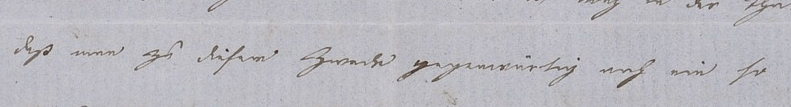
daß man zu diesem Zwecke gegenwärtig noch ein so
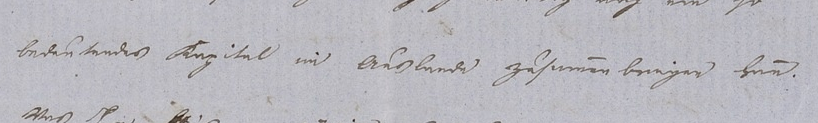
bedeutendes Kapital im Auslande zusammen bringen kann.
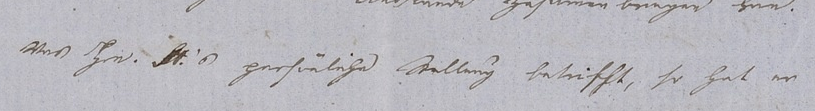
Was Hrn. St.'s persönliche Stellung betrifft, so hat er
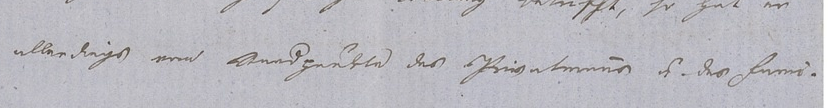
allerdings vom Standpunkte des Privatmanns u. des Fami-
